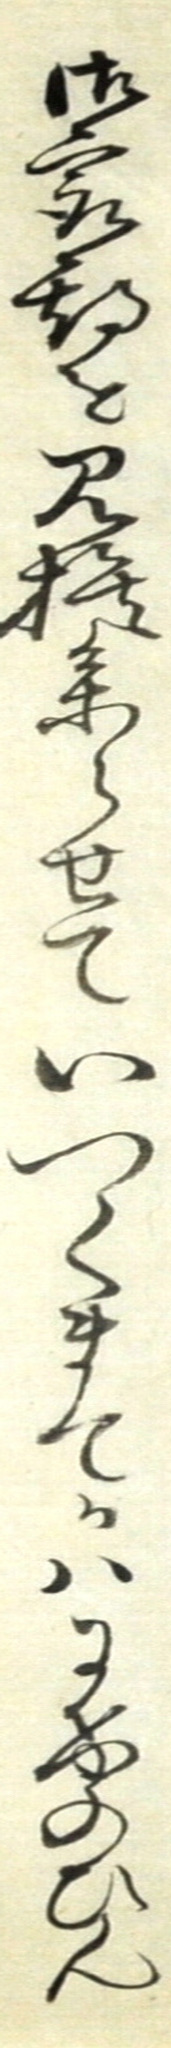御最期を見捨参らせていつくまてかはにけのひん
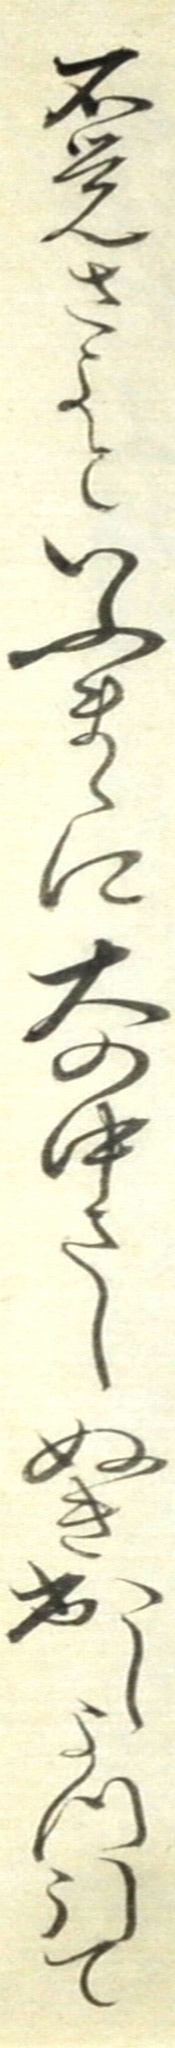不覚さよといふまゝに大の中さしぬき出しよつ引て
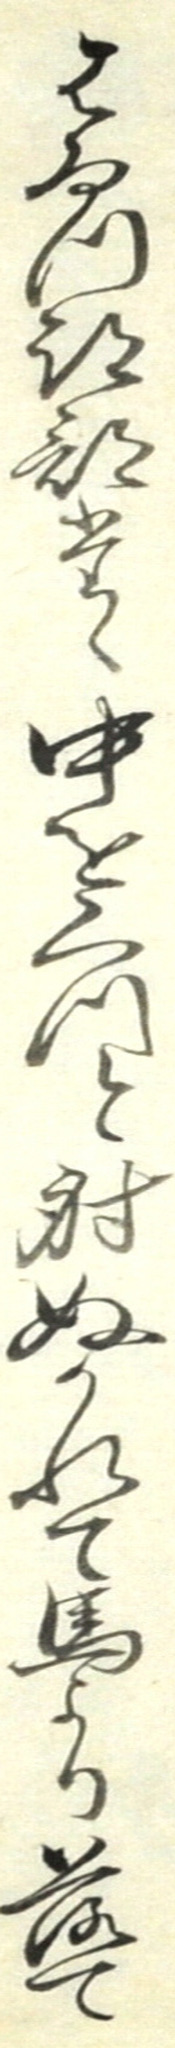はなつ跡部たゝ中をくつと射ぬかれて馬より落て
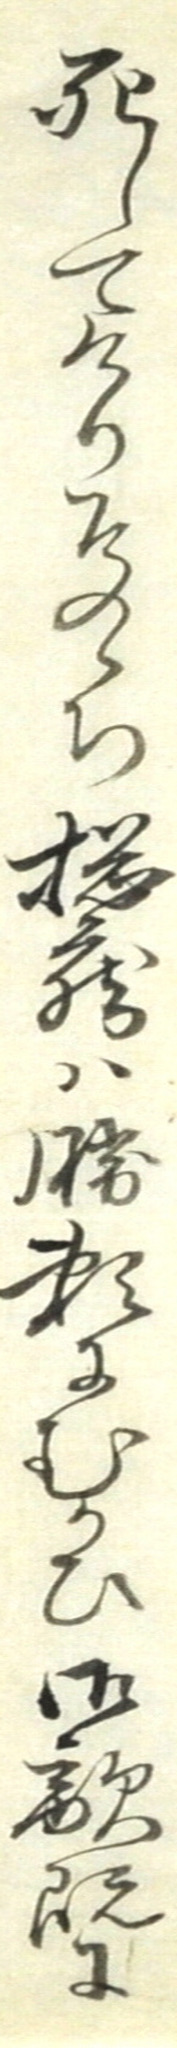死してけりそのゝち総蔵は勝頼にむかひ御敵既に
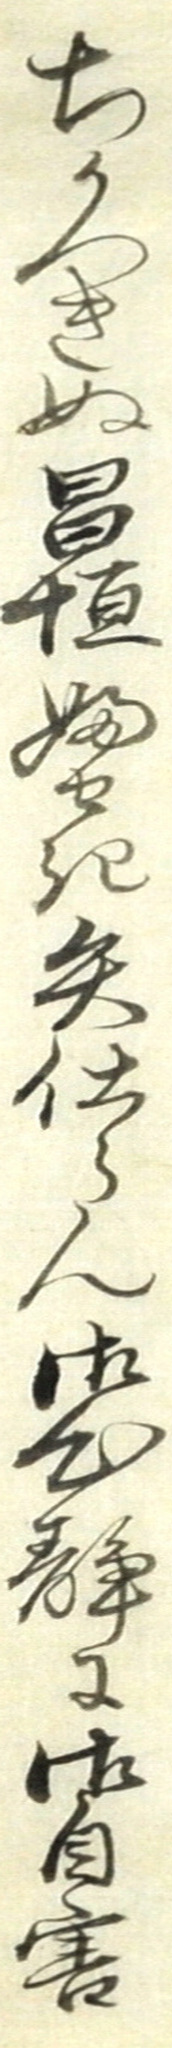ちかつきぬ昌恒ふせき矢仕らん御心静に御自害
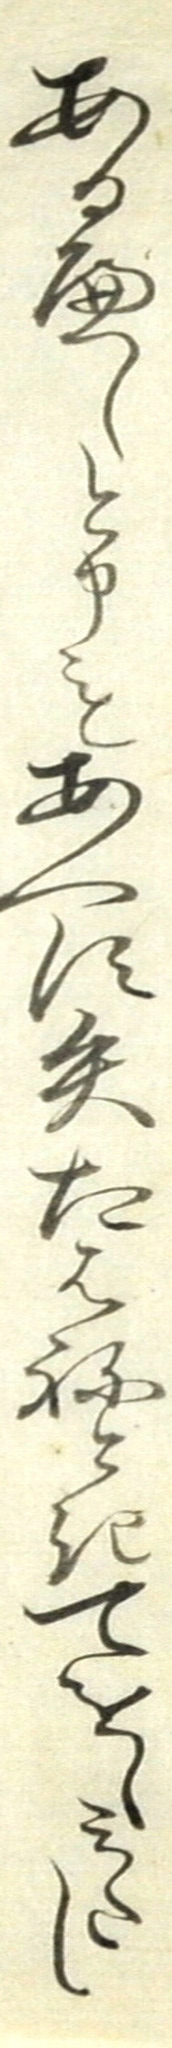あるへしと申もあへす矢たはねときてをしみたし
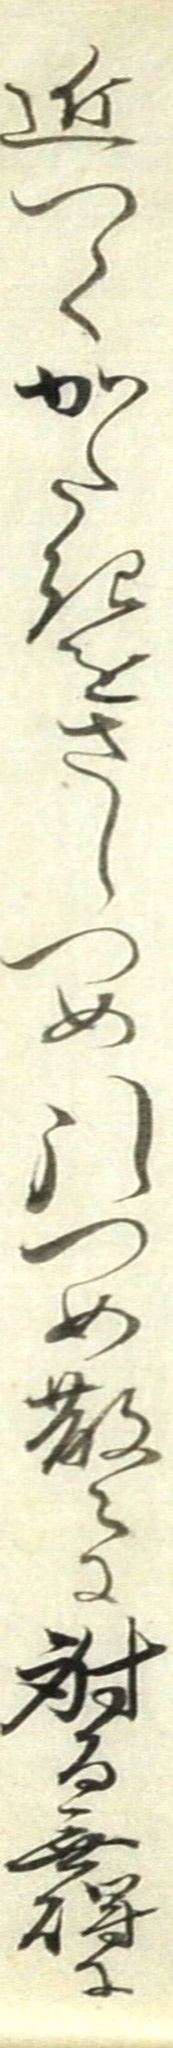近つくかたきをさしつめ引つめ散々に射る無碍に
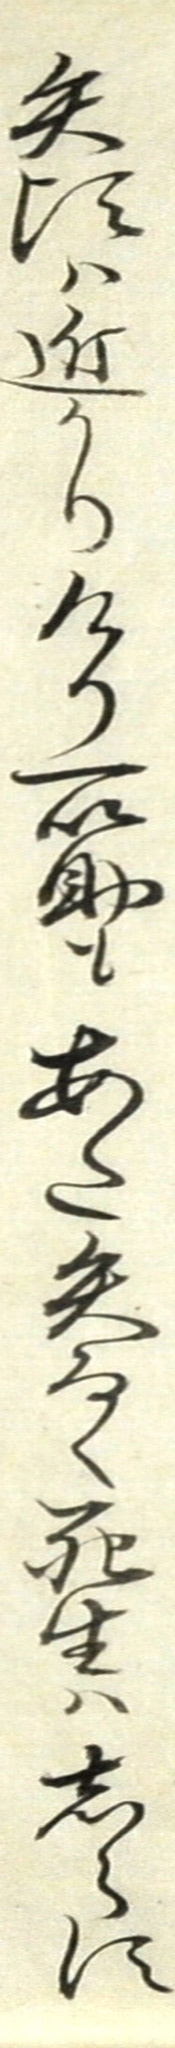矢頃は近かりけり一筋もあた矢なく死生はしらす
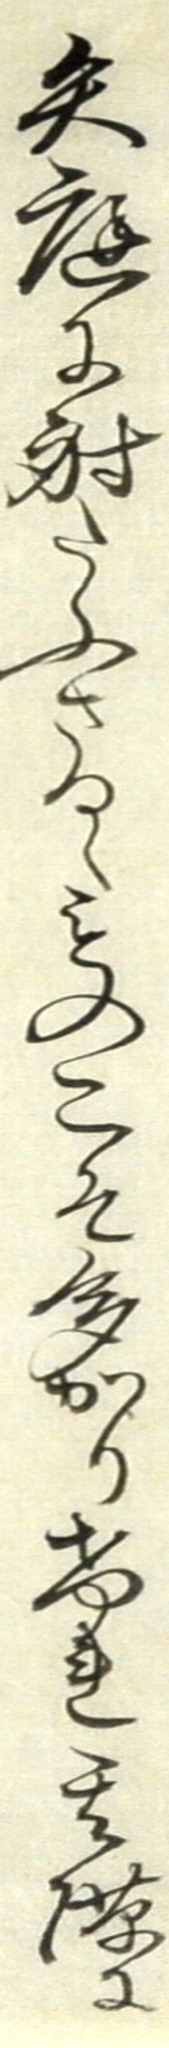矢庭に射たふさるゝものこそ多かりけれ其隙に
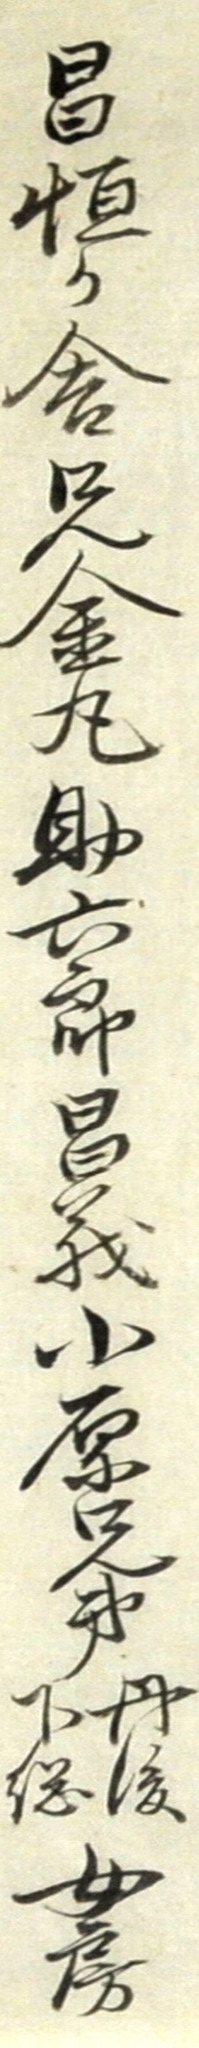昌恒か舎兄金丸助六郎昌義小原兄弟丹後下総女房
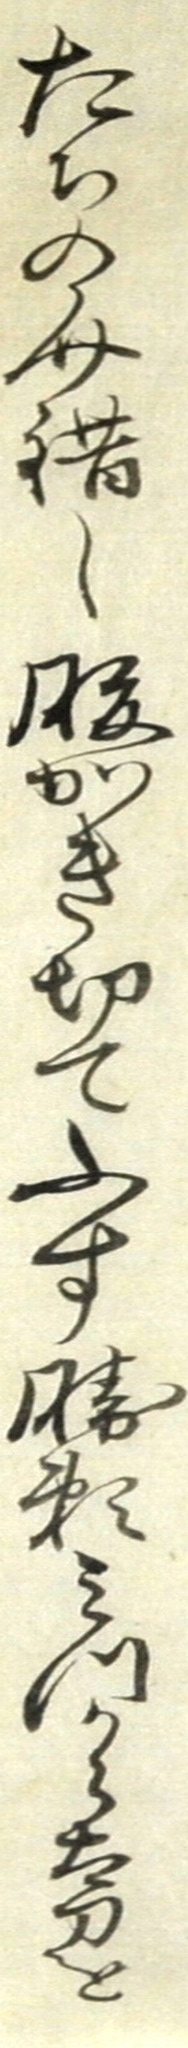たちの介錯し腹かき切てふす勝頼みつから太刀を
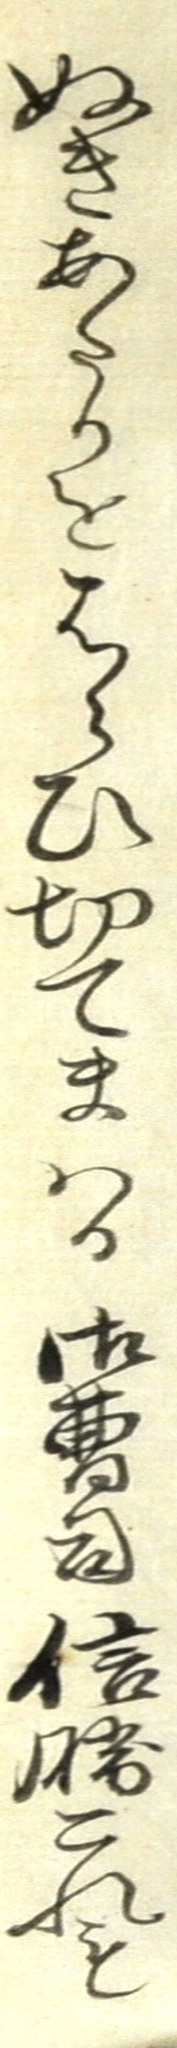ぬきあたりをはらひ切てまはる御曹司信勝これも

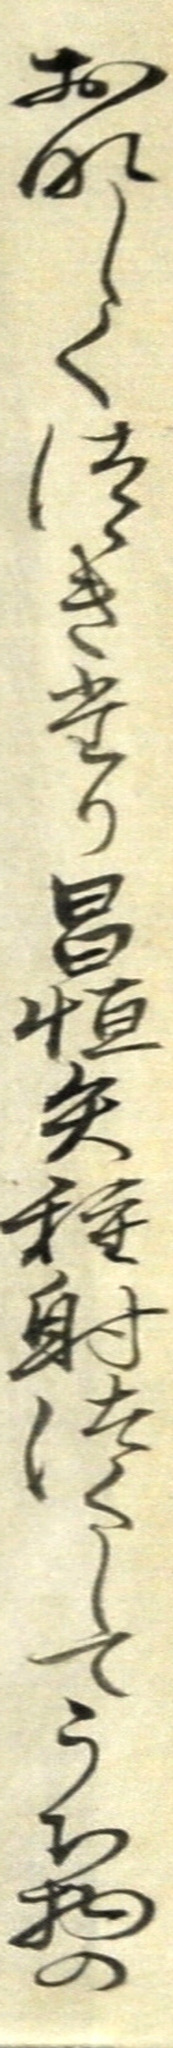おなしくつゝきたり昌恒矢種射つくしてうち物の
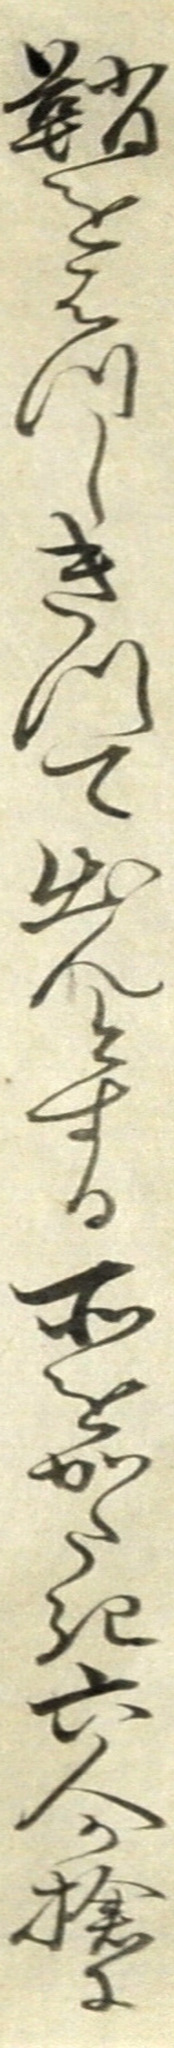鞘をはつしきつて出んとする所をかたき六人か槍に
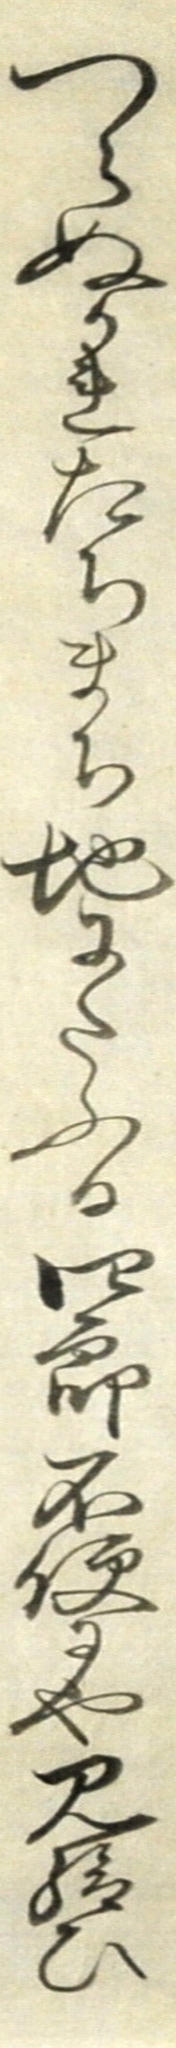つらぬかれたちまち地にたふる四郎不便にや見給ひ
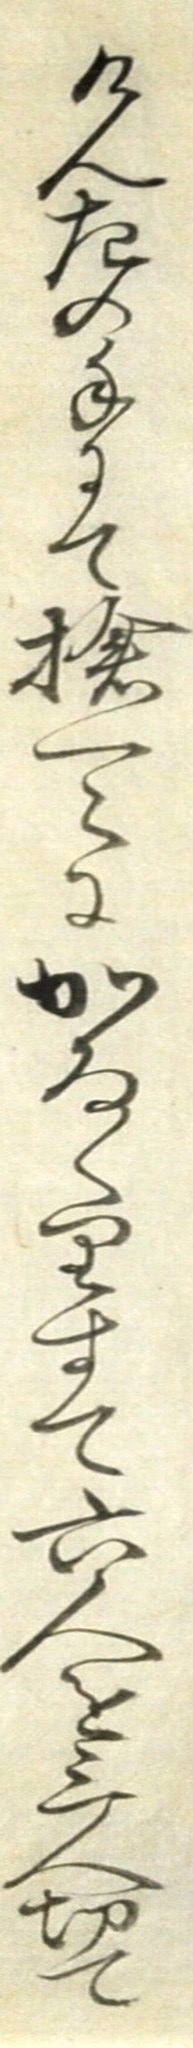けん左の手にて槍一々にかなくりすて六人を三人切て
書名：藩翰譜（六）
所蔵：伊那市立高遠町図書館・合同会社AMANE
